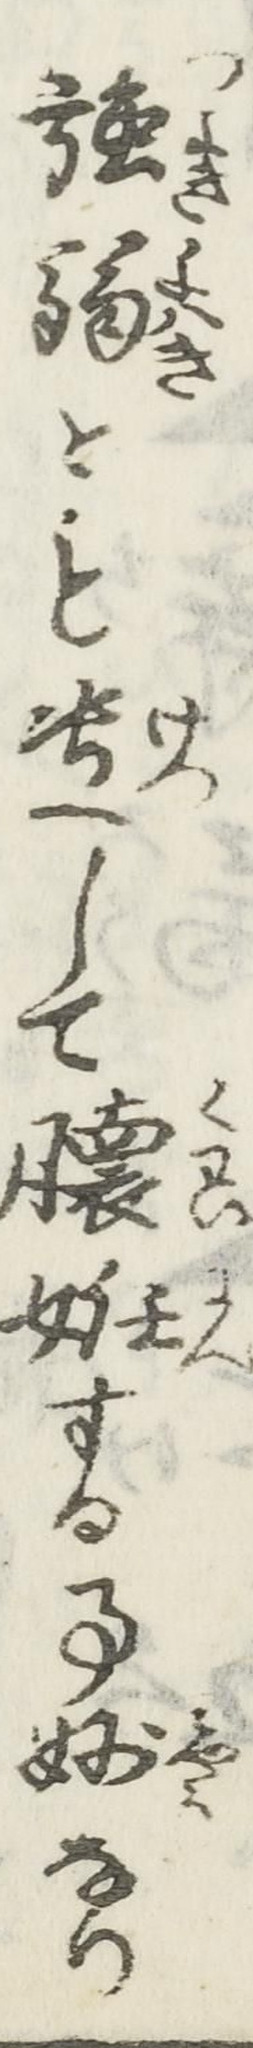強弱とも決して懐妊する事妙なり
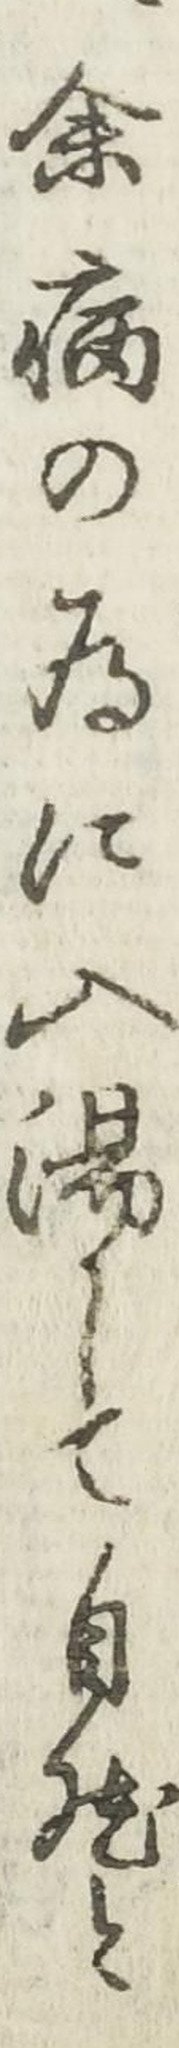余病の為に入湯して自然と
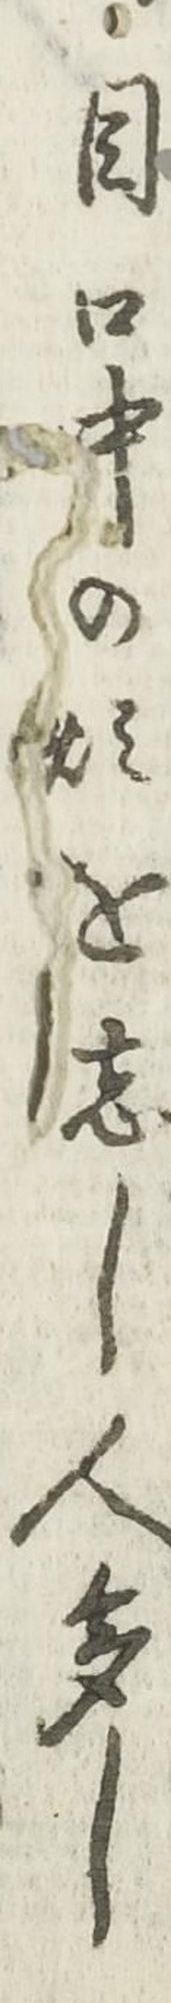目口中の煩を忘し人多し
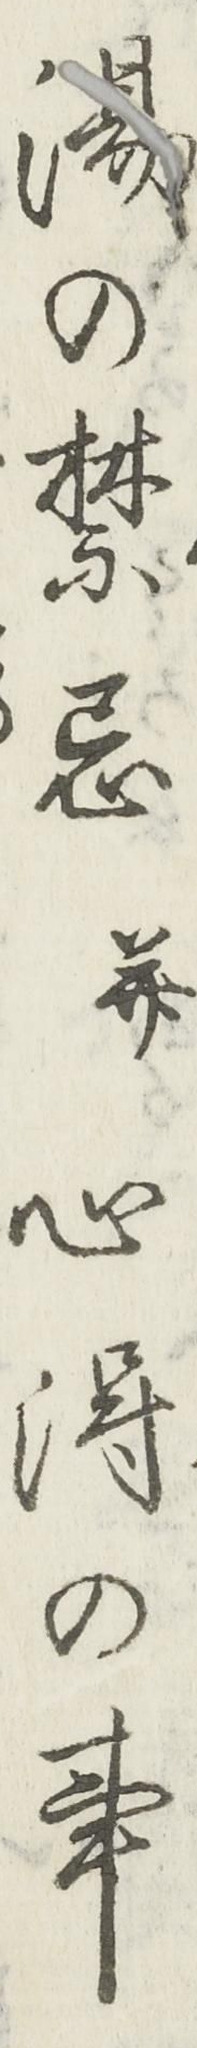湯の禁忌并心得の事
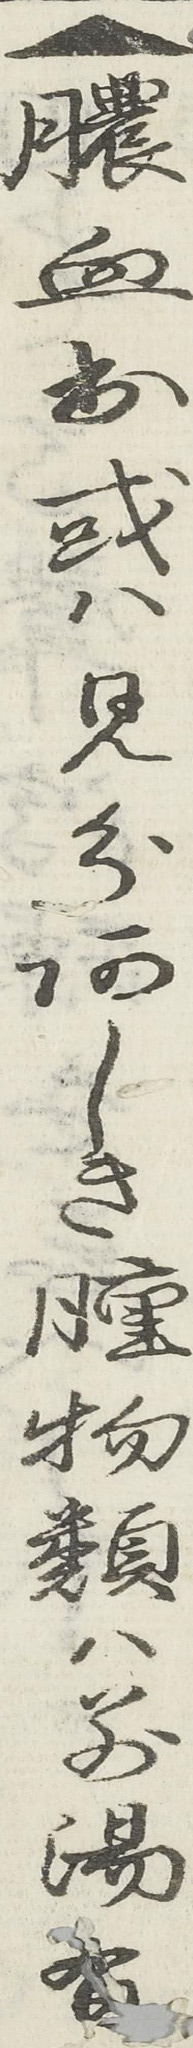▲膿血出或は見分あしき腫物類は別湯有
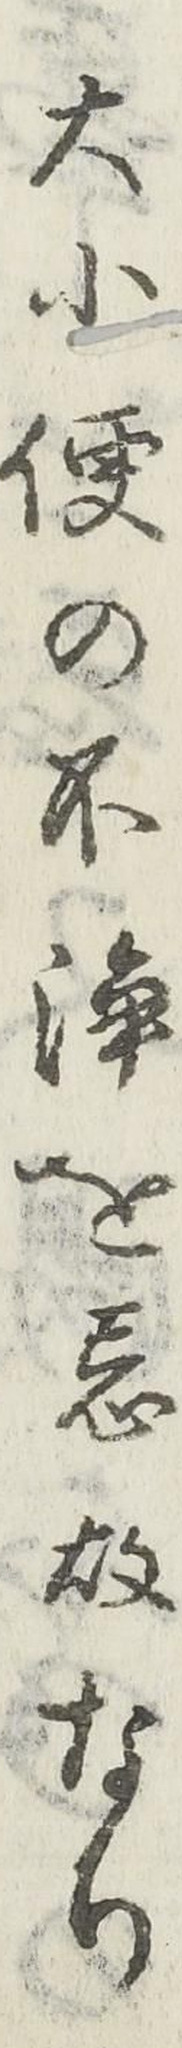大小便の不浄を忌故なり
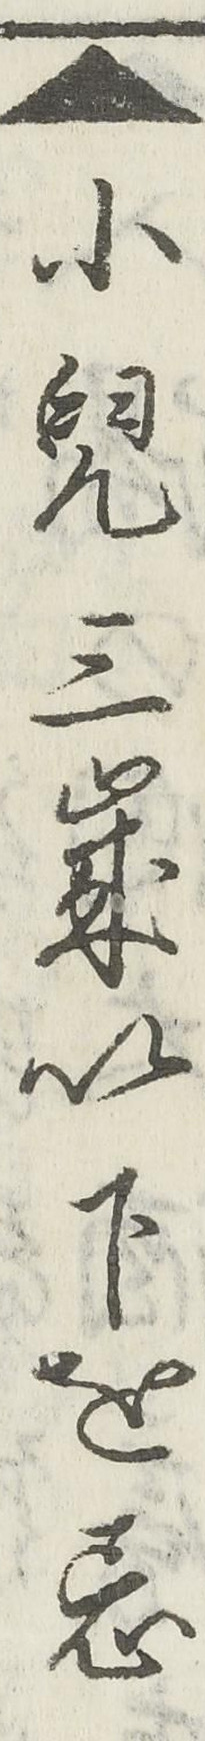▲小兒三歳以下を忌
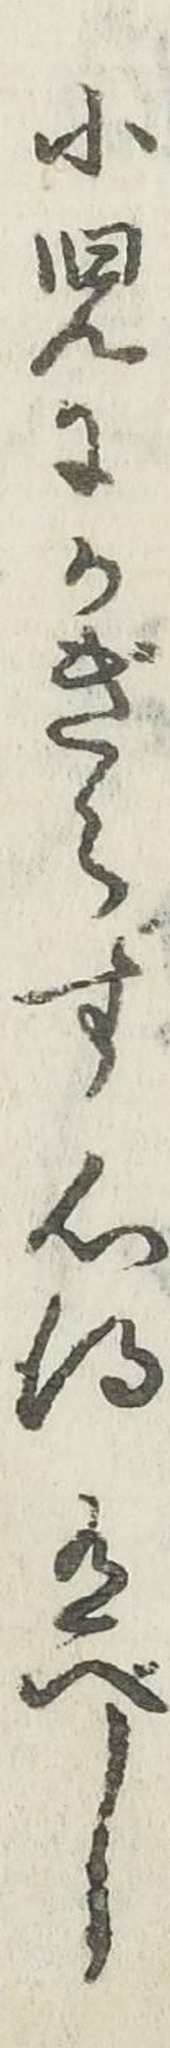小児にかぎらず心得有べし
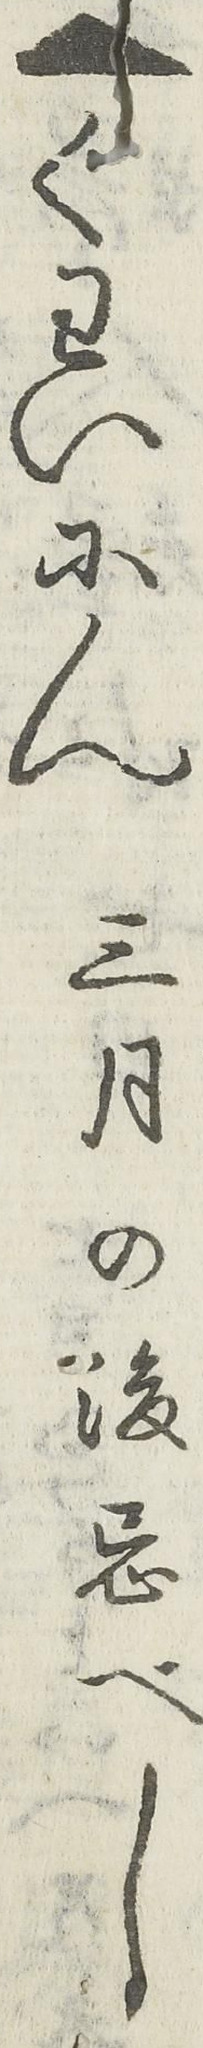▲くわいにん三月の後忌べし

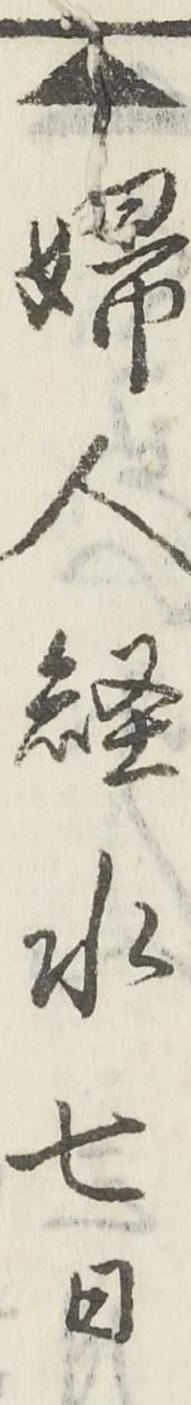▲婦人経水七日
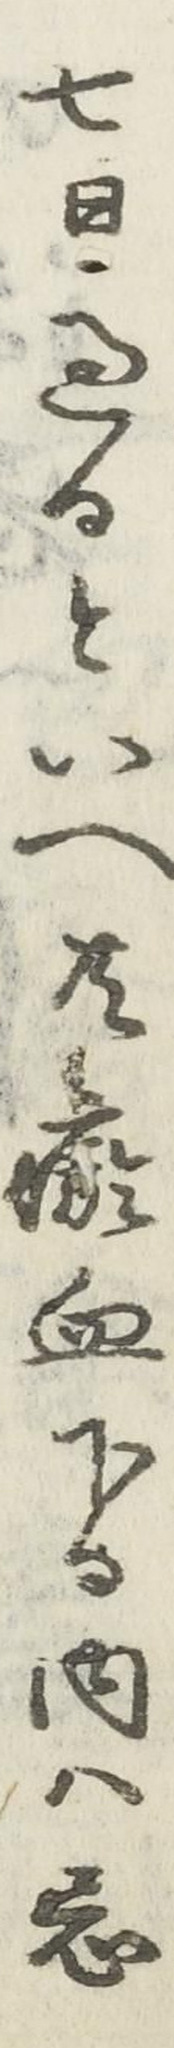七日過るといへ共瘀血下る内は忌
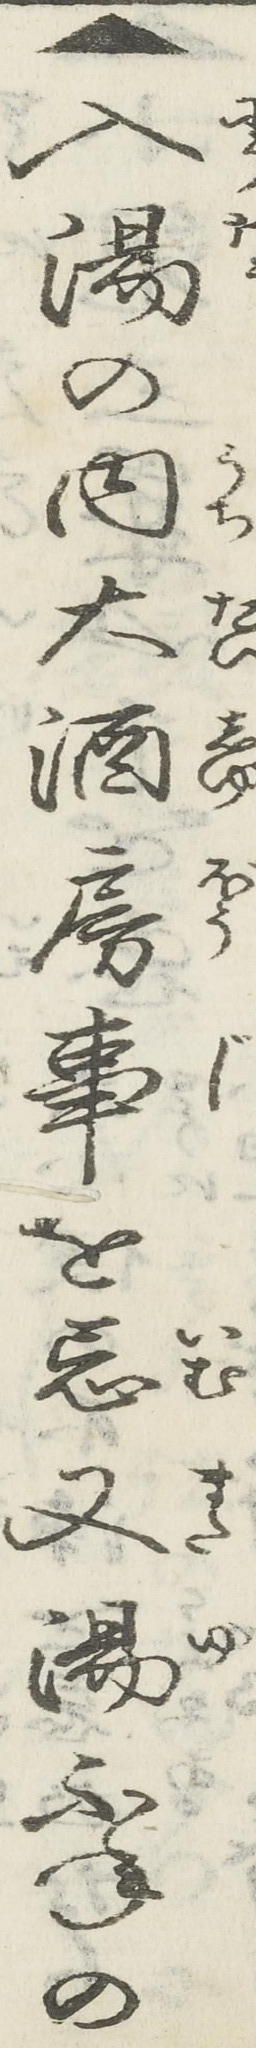▲入湯の内大酒房事を忌又湯ふねの
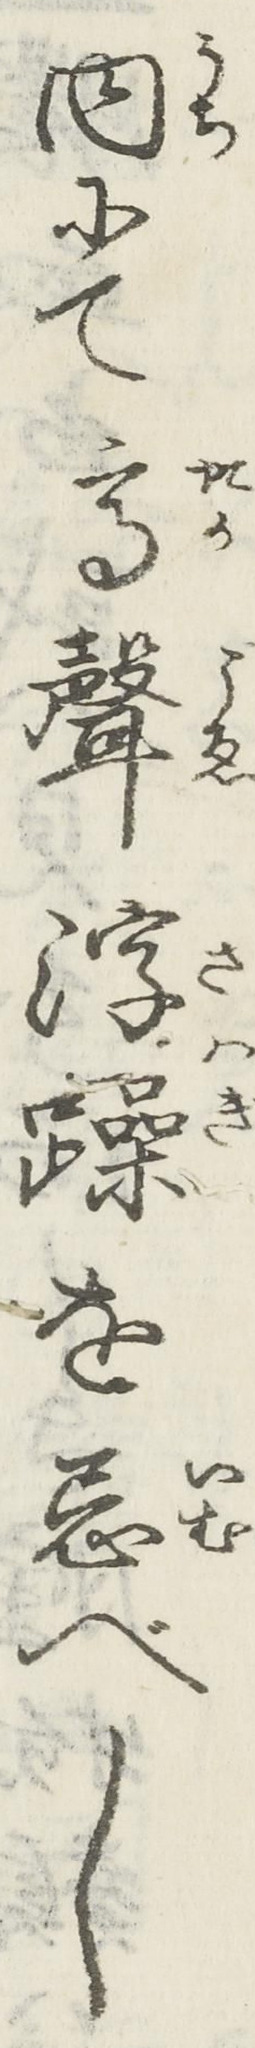内にて高聲浮躁を忌べし
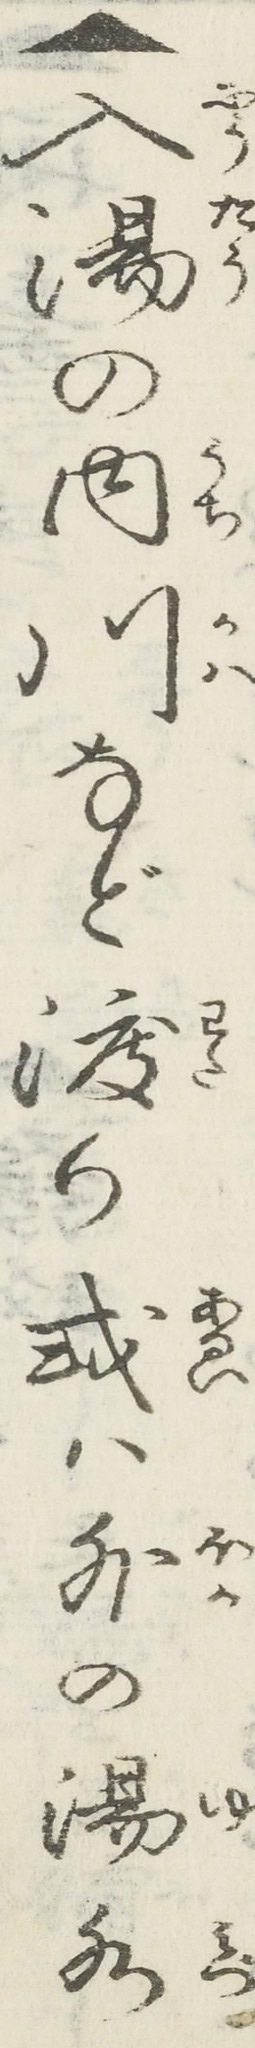▲入湯の内川など渡り或は外の湯水
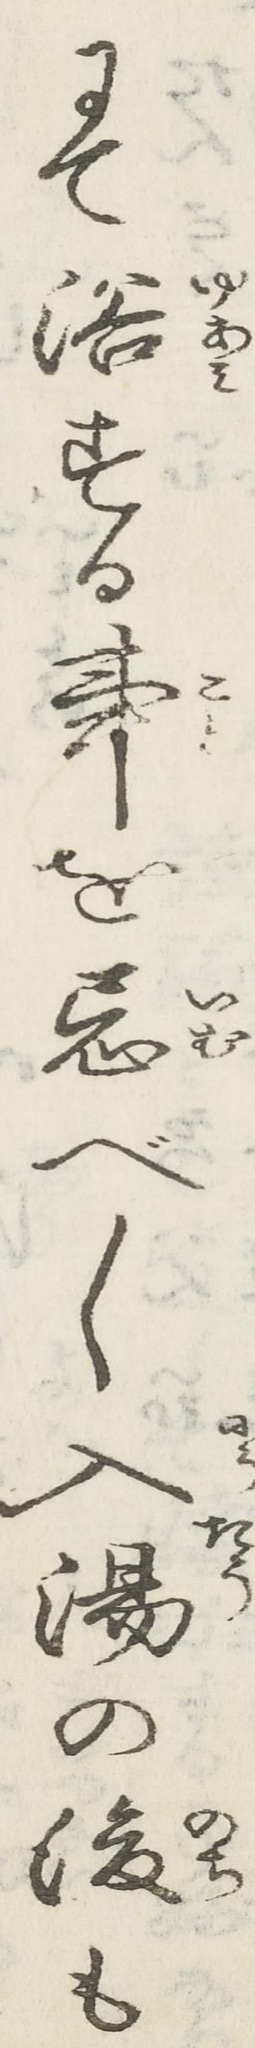にて浴する事を忌べし入湯の後も
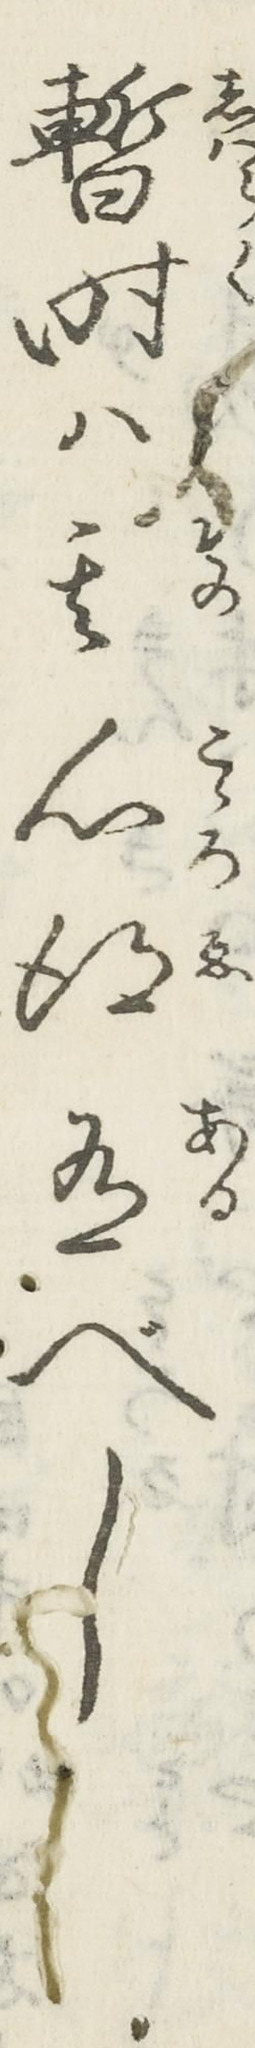暫時は其心得有べし
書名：温泉来由記
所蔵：東京大学地震研究所図書室 Earthquake Research Institute Library, The University of Tokyo, JAPAN
